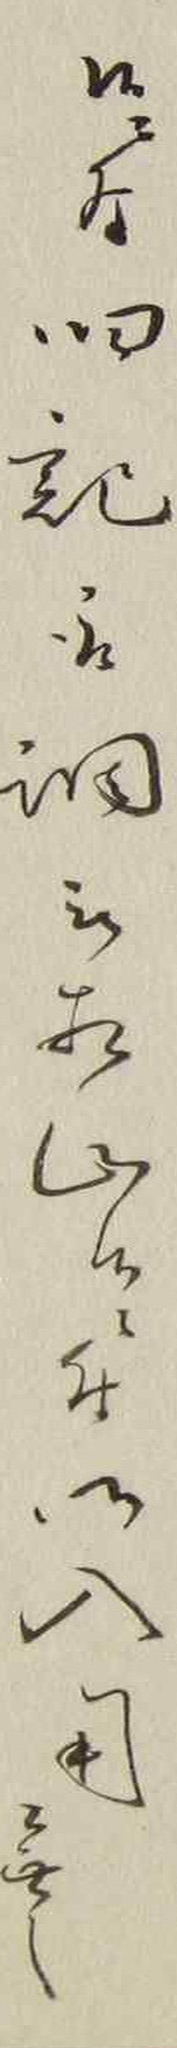候ニ付旧記取調被相止候ニ付御入用無之
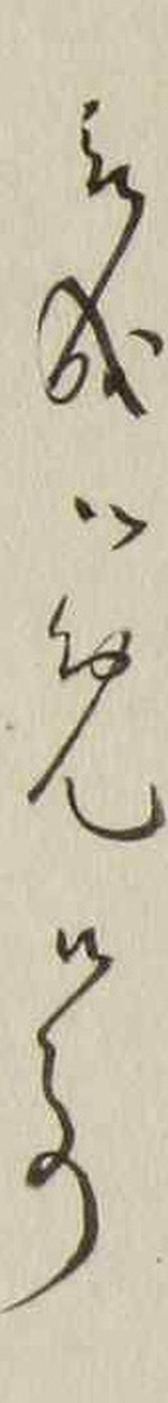被成御免候事

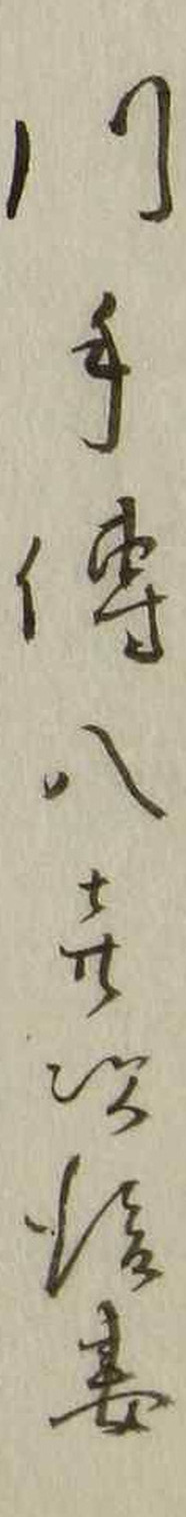女川手伝八喜次後妻
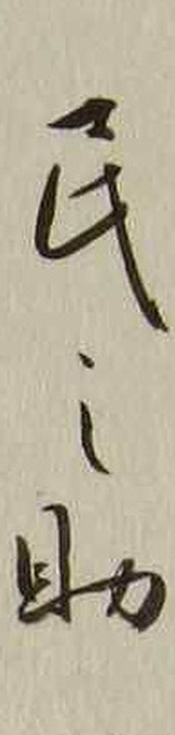民之助
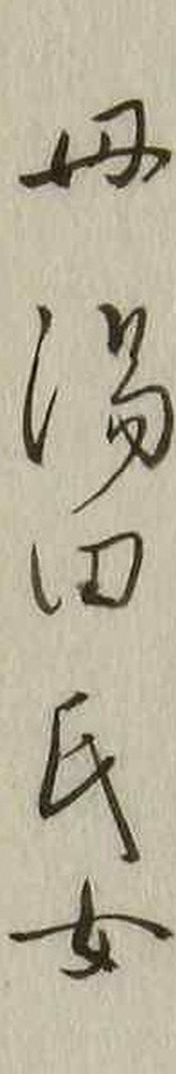母湯田氏女
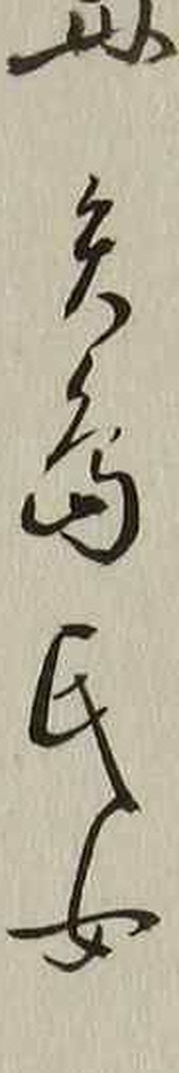母矢島氏女
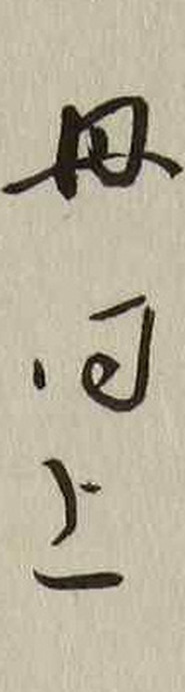母同上
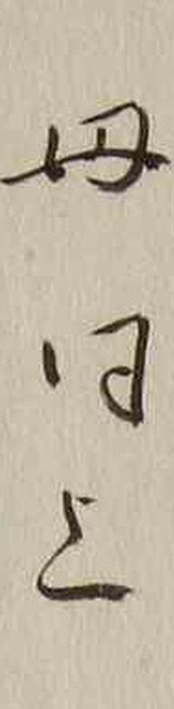母同上

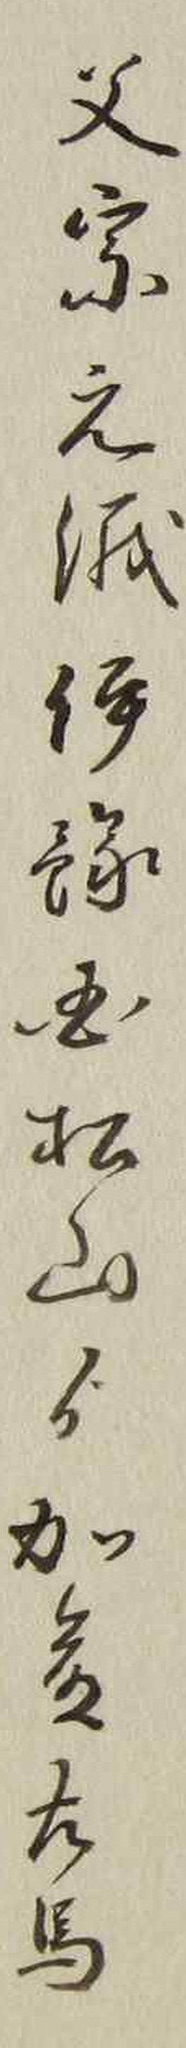父宗元儀伊豫国松山より加藤左馬
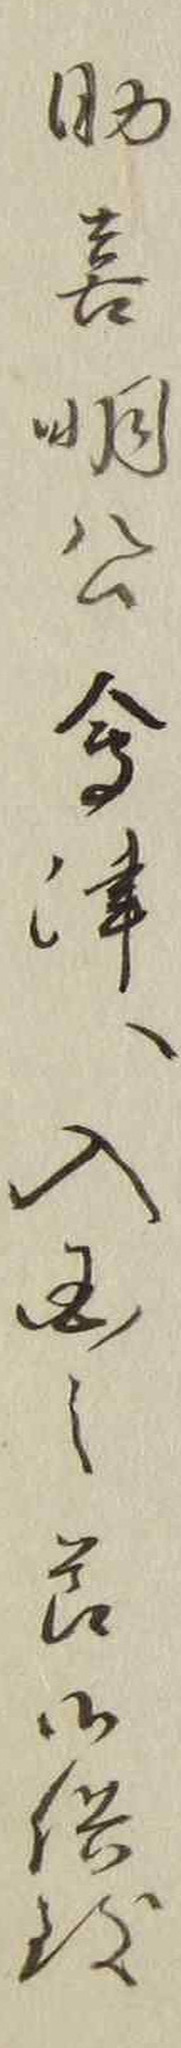助喜明公会津へ入国之節御供致

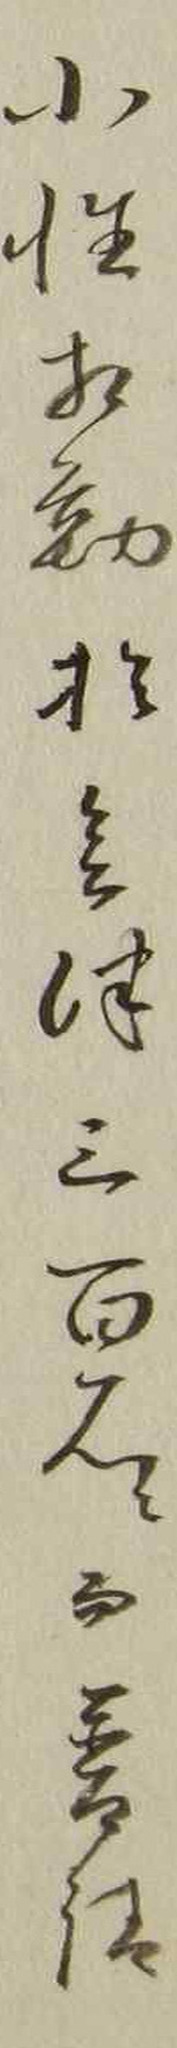小性相勤於会津三百石ニ而普請
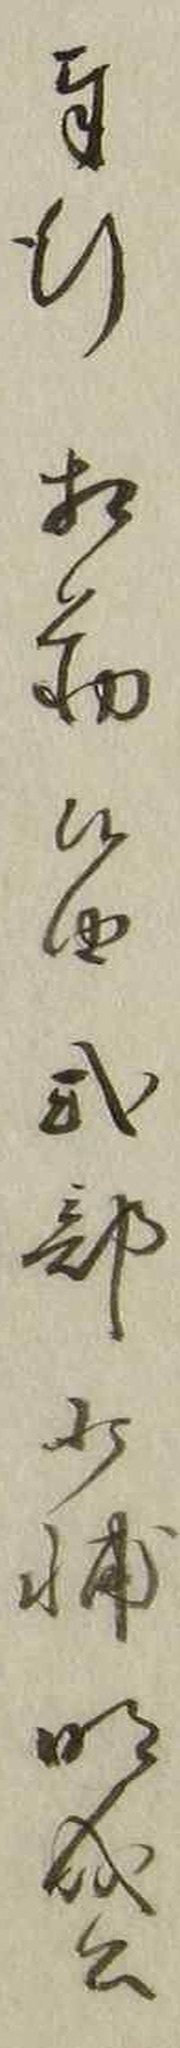奉行相勤候由式部少輔明成公
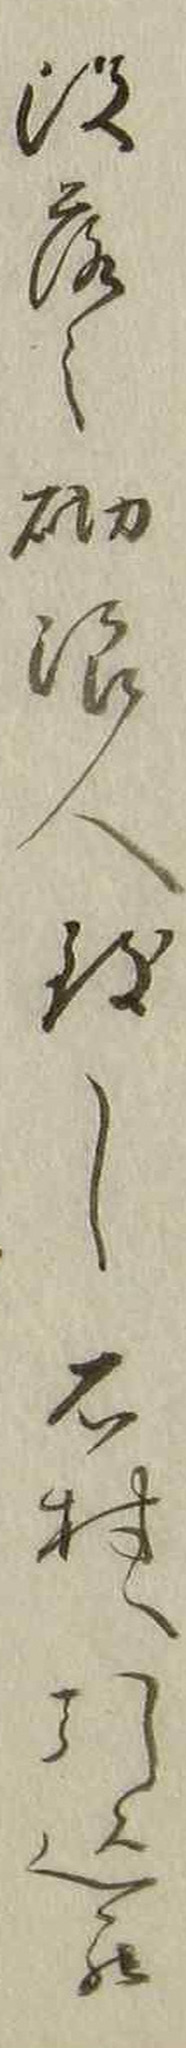没落之砌浪人致し右村へ引込罷
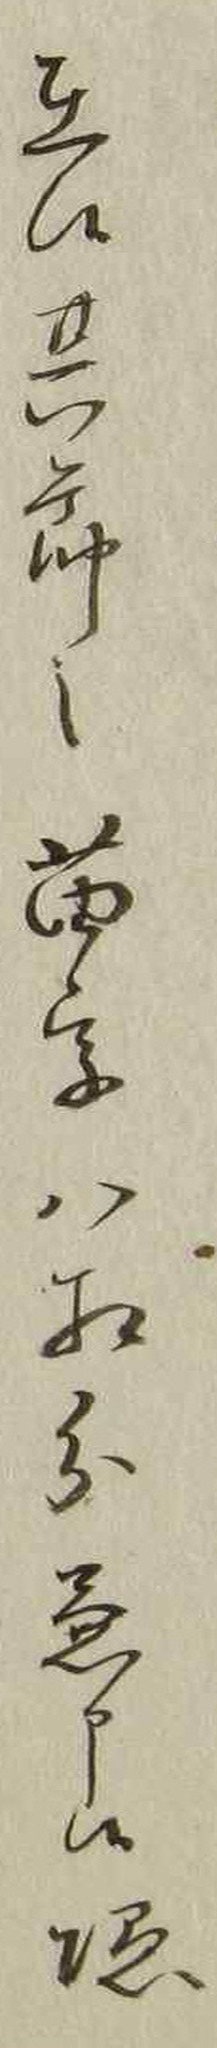在候其節之苗字ハ相分兼申候隠
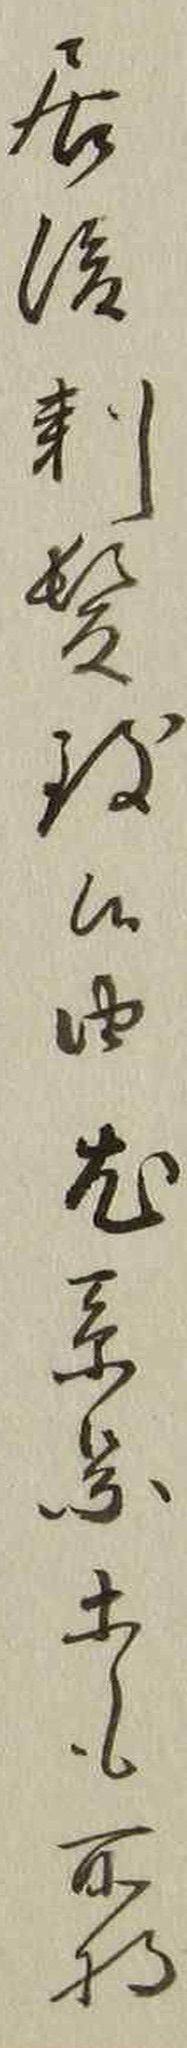居後剃髪致候由尤系図等も所持
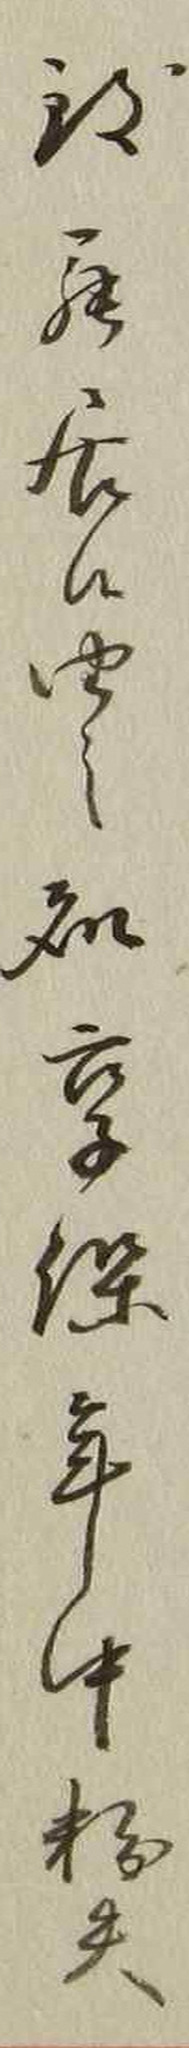致罷居候由之処享保年中ふ紛失
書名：諸士系譜　巻之8　い之部8
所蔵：会津若松市立会津図書館
